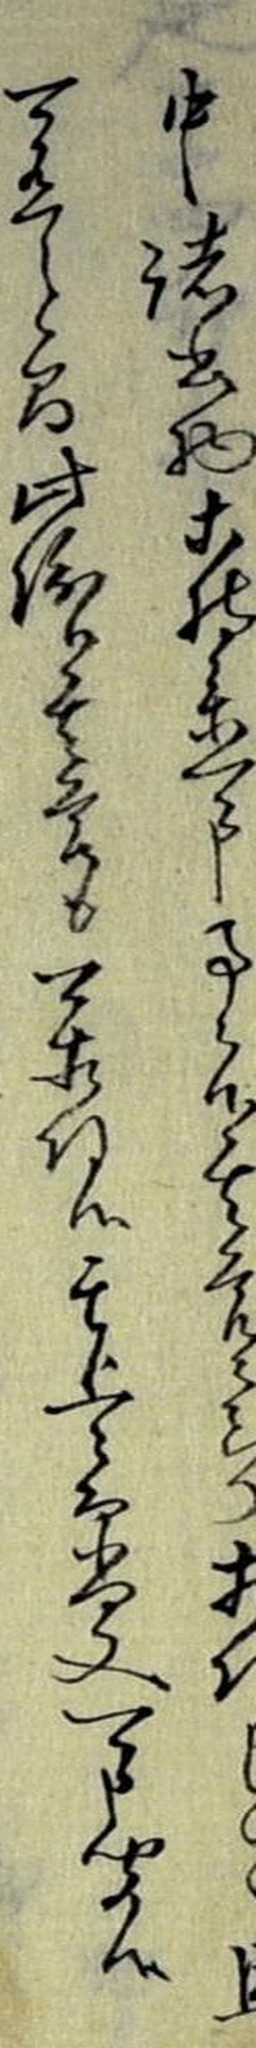可有之候間此儀ハ其節も可相伺候其上ニ而尚又可申聞候
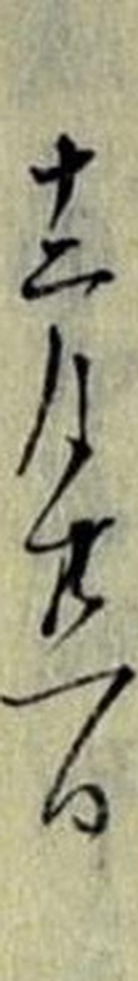十二月廿一日

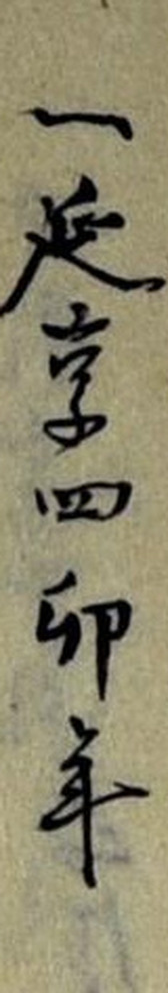一延享四卯年
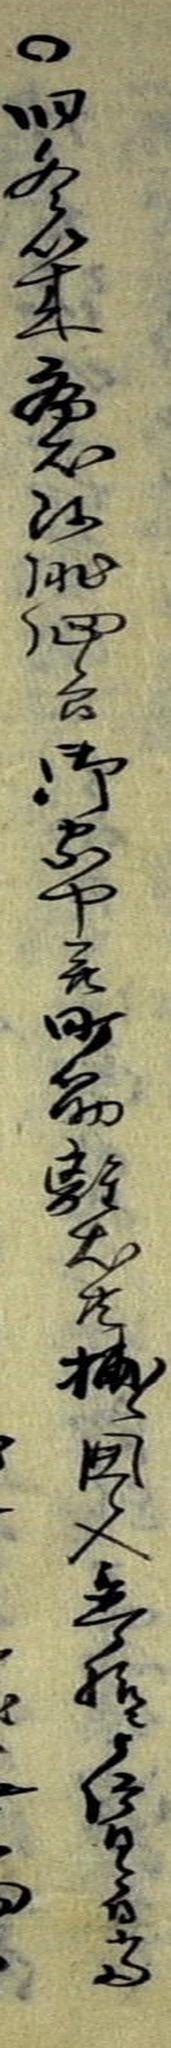〇旧冬以来病犬致徘徊候間御家中并町筋離犬共捕へ囲へ入置候様ニ被仰付候ニ付当
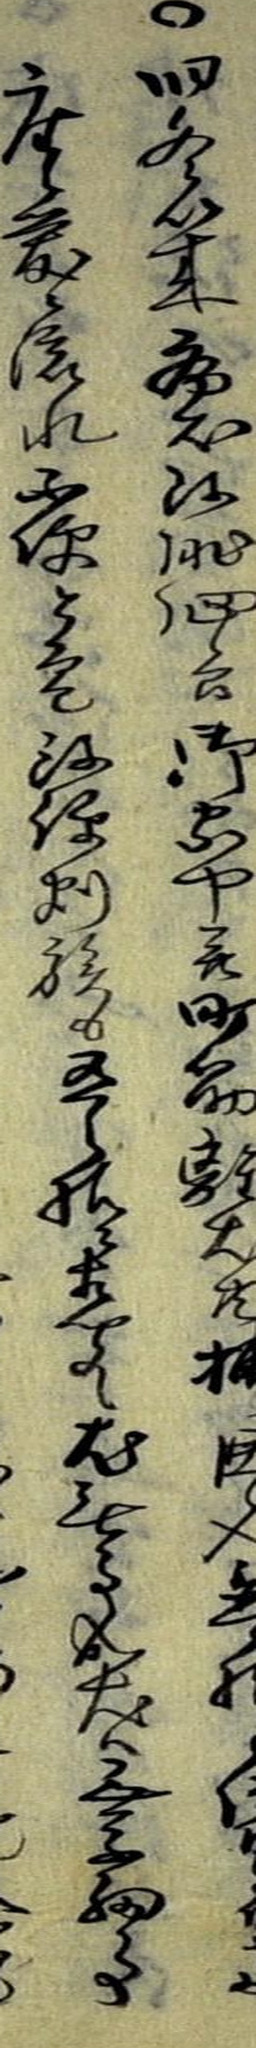座之ニ流れ不便と而も致評判族も有之様ニ相聞候尤無事成犬ハ無子細事
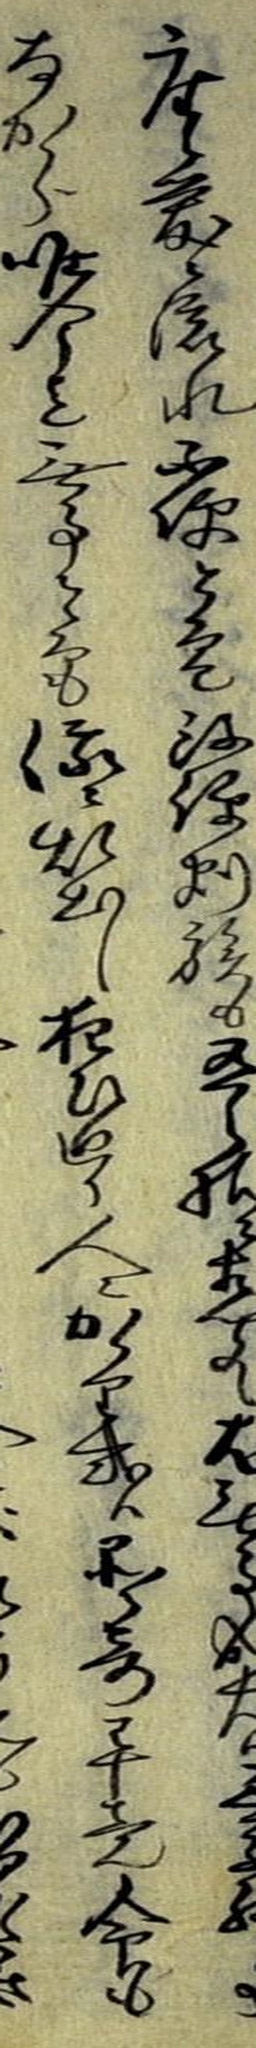なから唯今迄無事ニ候而も俄ニ煩出し狂ひ廻り人ニかゝり或ハ品ニ寄畢竟命も
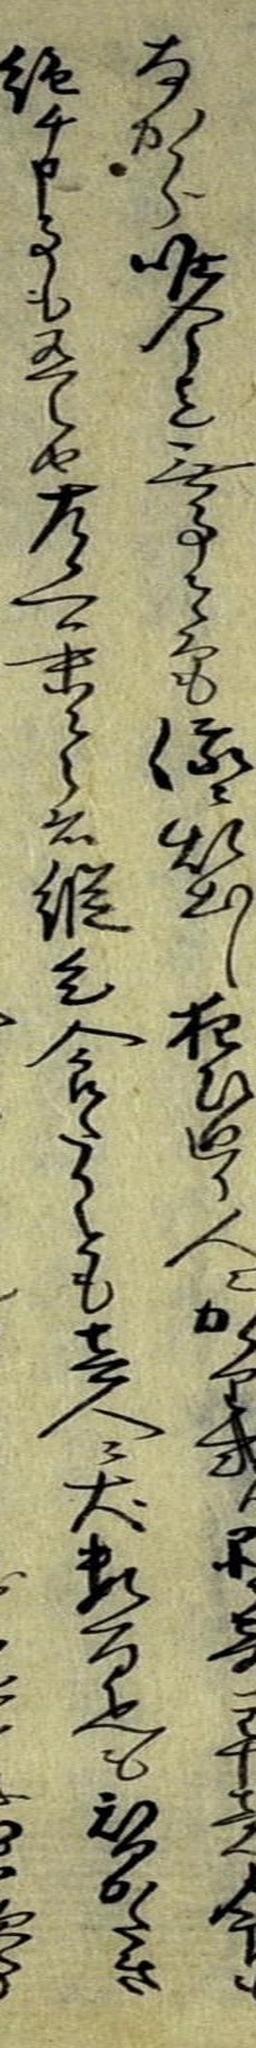絶チ申事も有之由左候ヘハ末々之者縦乞食たりとも壱人ニ犬数百疋も替かたき
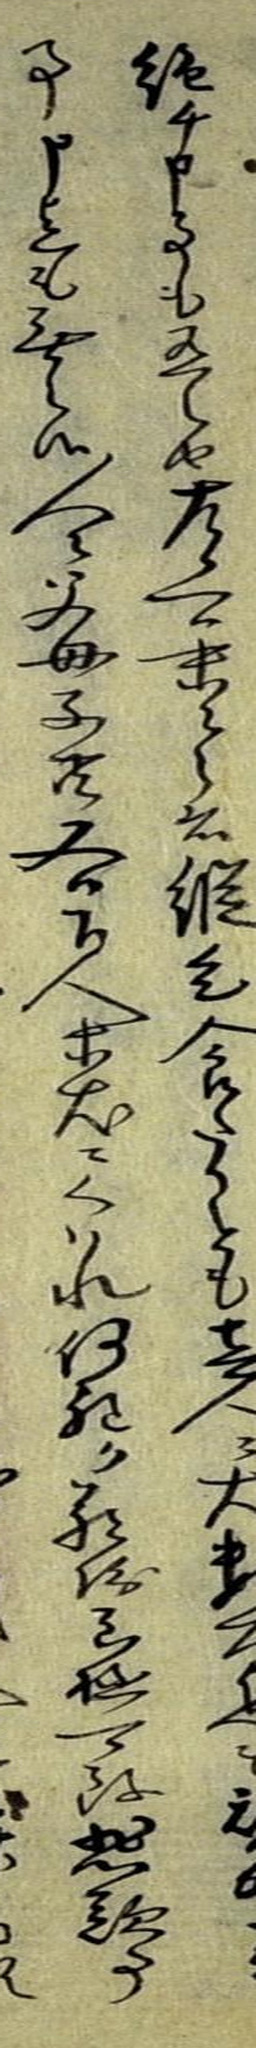事申迄も無之候人々父母子共又ハ下人等犬ニくハれ何程か難儀至極可致愁歎事
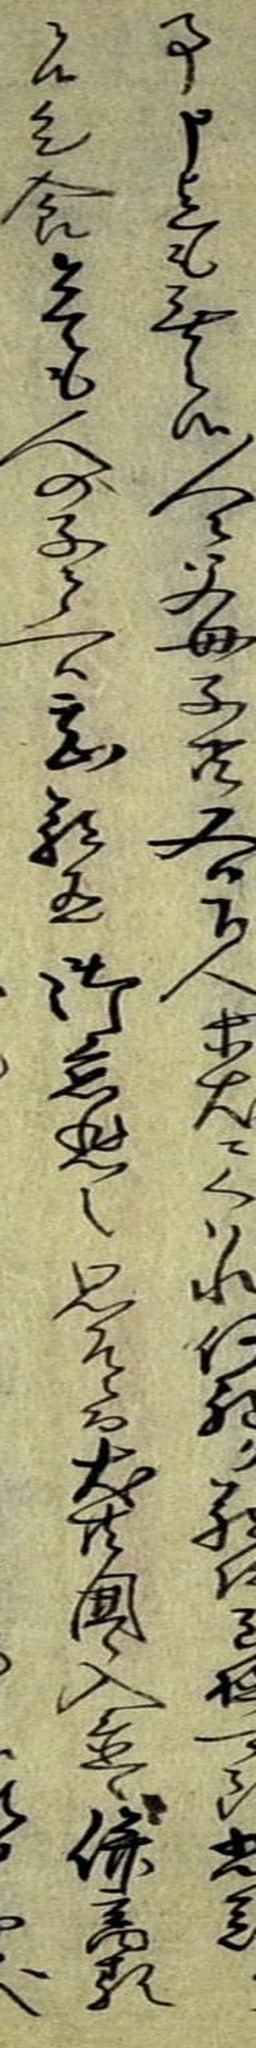ニ候乞食とても人の子ニ候ヘハ甚難有御慈悲之思召ニ而犬共囲へ入置候併畜類
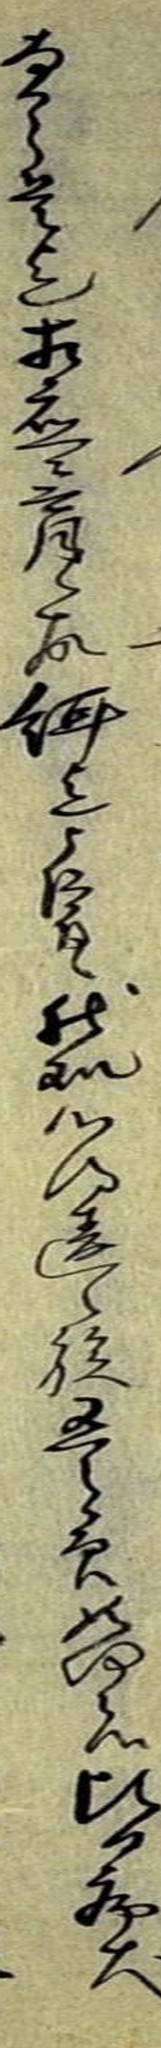なから是迄相応ニ育候故餌迄被仰付候然処心得違之族有之候而ハ如何ニ候頃日病犬
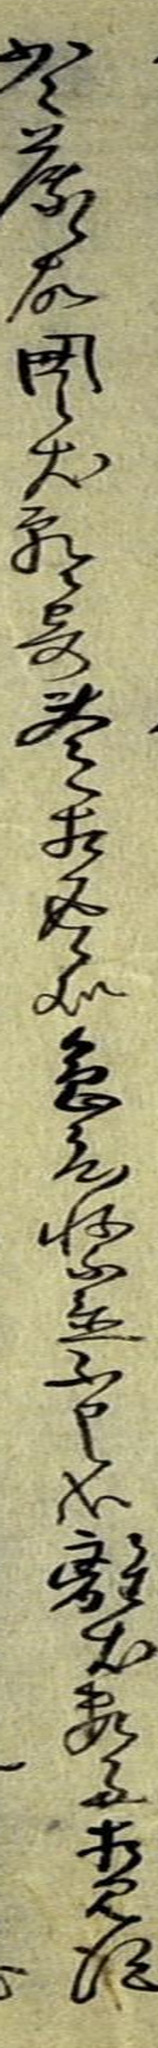少々薄候故囲之犬願ニ寄夫々へ相返候処急度繋置不申候哉離犬数多相見得
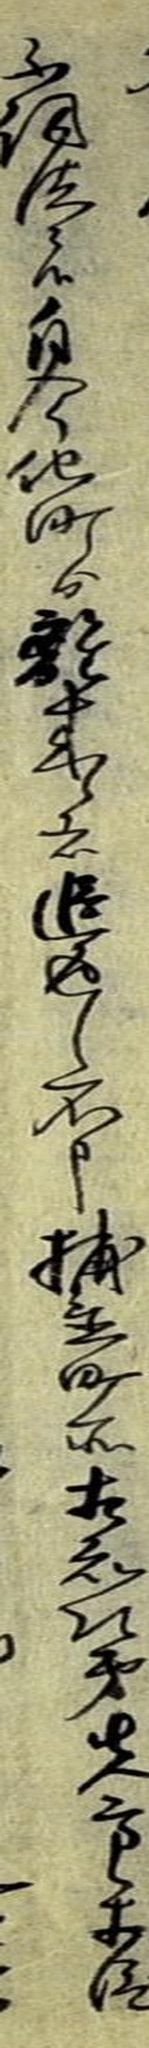不調法ニ候自今他町ゟ離来候者追返し不申捕置町所相知次第先方へ相渡
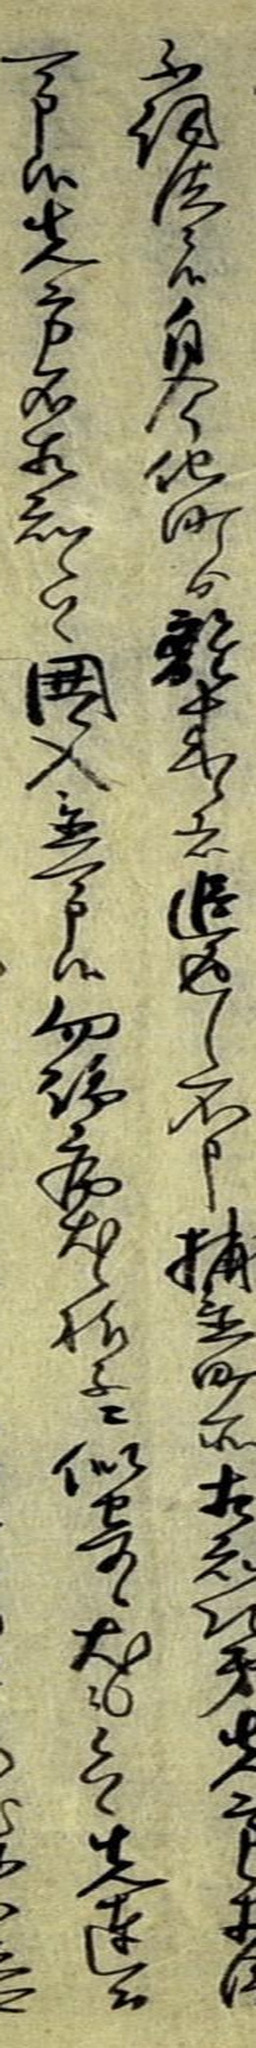可申候先方不相知候ハヽ囲へ入置可申候勿論病犬之様子ニ似寄候犬も候ハヽ先達而
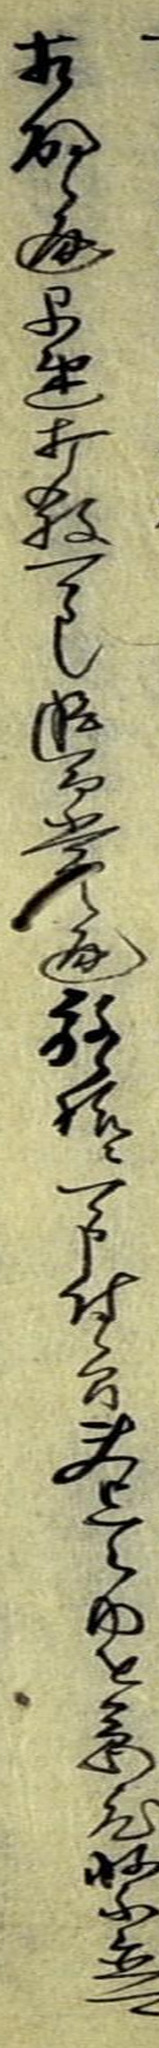相触候通早速打殺可申候追而常之通放候様ニ可申付候間夫迄之内と急度繋置可
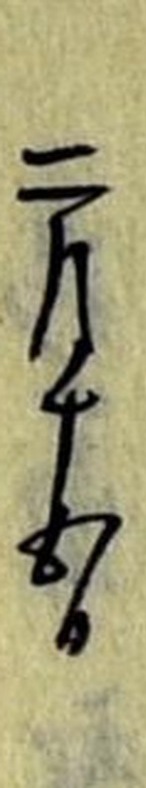二月十五日

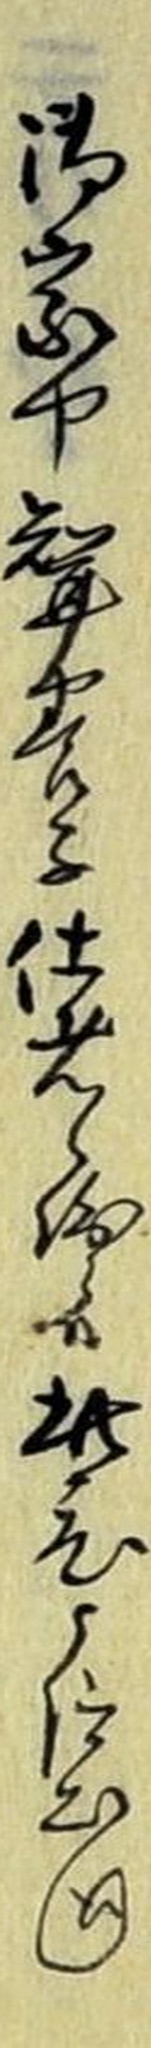御家中聟養子仕者之儀ニ付此度被仰出趣
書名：命令之部 一
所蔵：福井県文書館 Fukui Prefectural Archives
